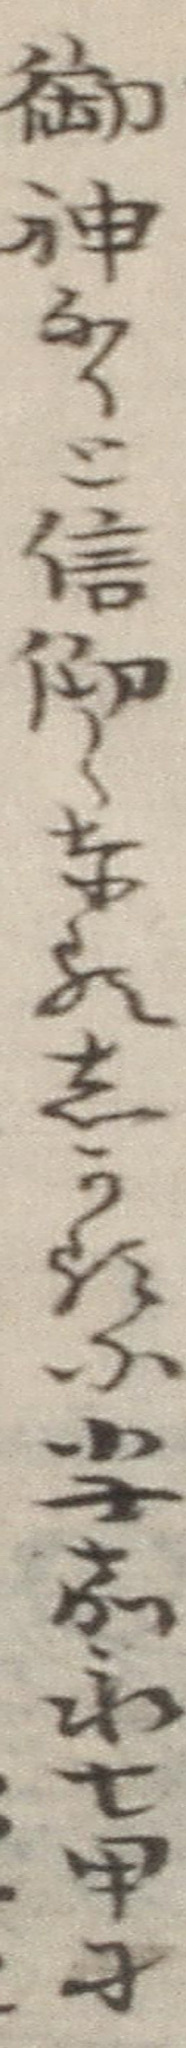御神なりと信仰し奉るしかるに当嘉永七甲寅
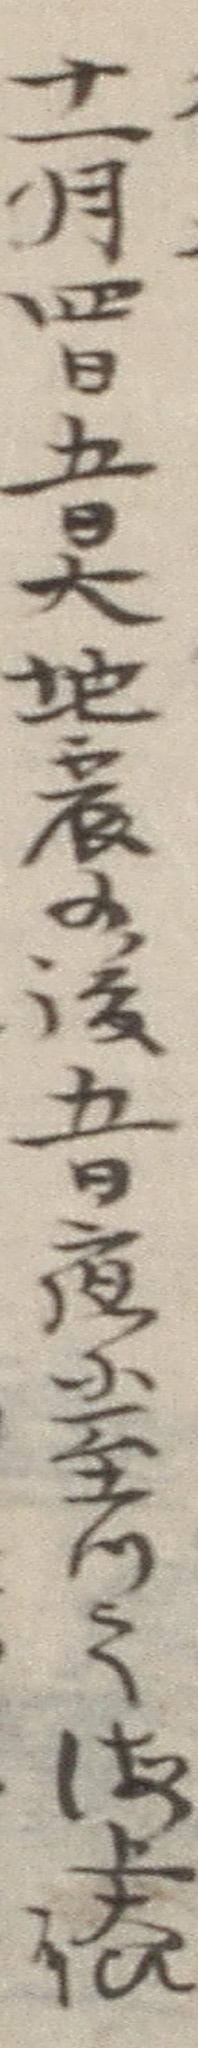十一月四日五日大地震の後五日夜に至つて海上大ひに
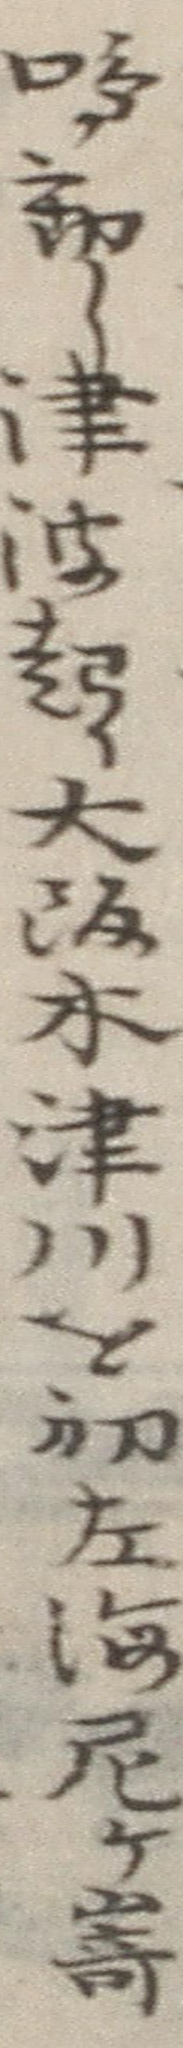鳴動し津波起り大阪木津川を初左海尼ヶ嵜
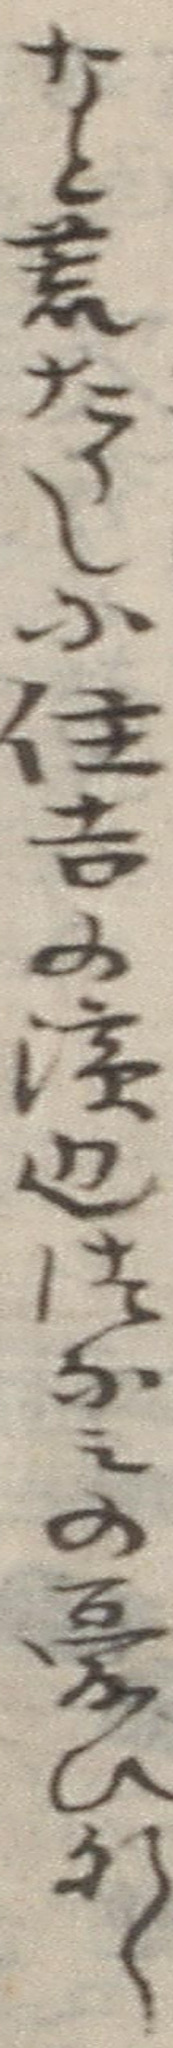なと荒たりしに住吉の浜辺つなみの憂ひなし
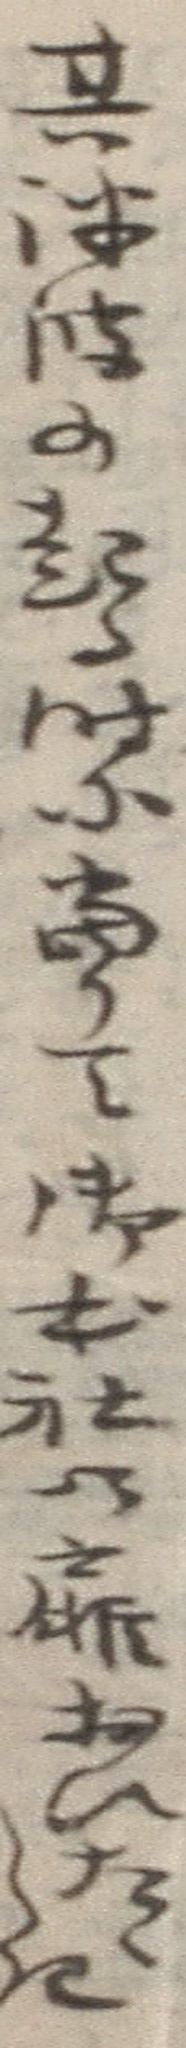其津波の起る時に当りて御本社の扉おひたゝしき
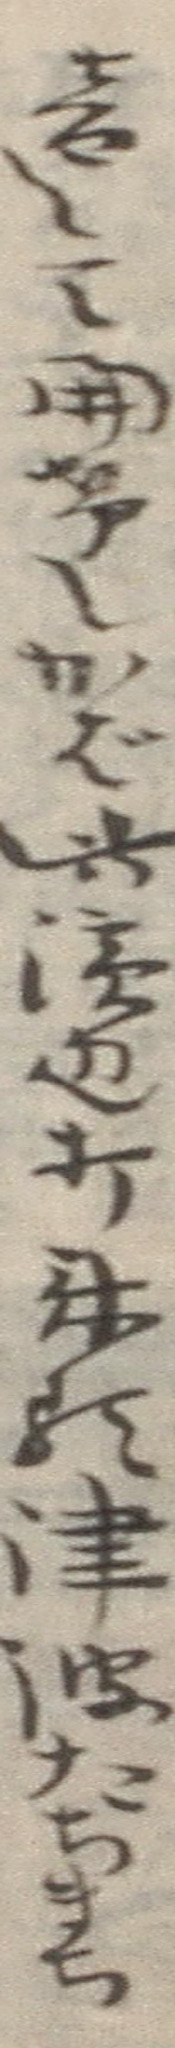音して開けしかば此浜辺打来る津波たちまち
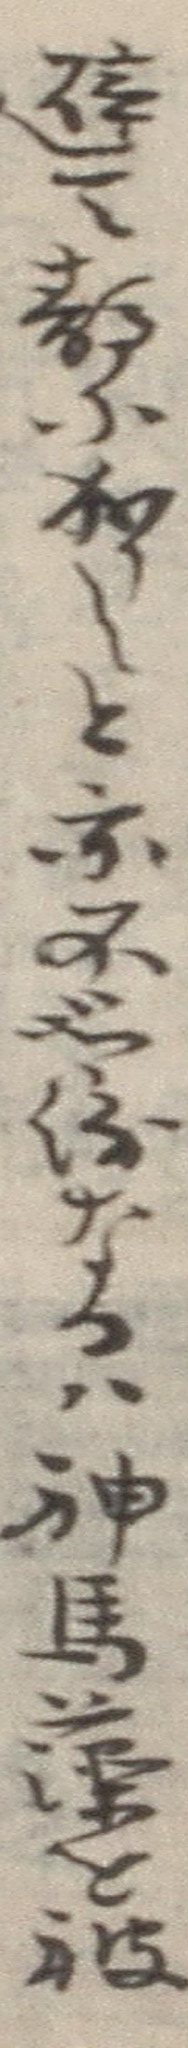避て静に成りしと亦不思議なるは神馬藻を被
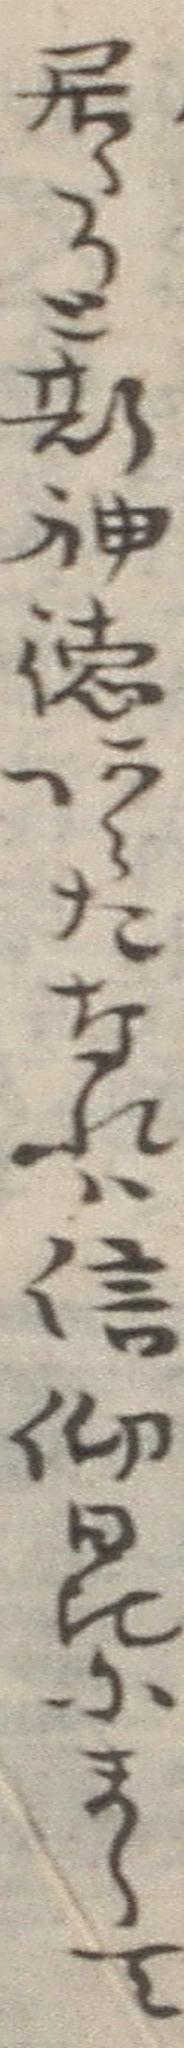居たりと斯神徳あらたなれは信仰日比にまして
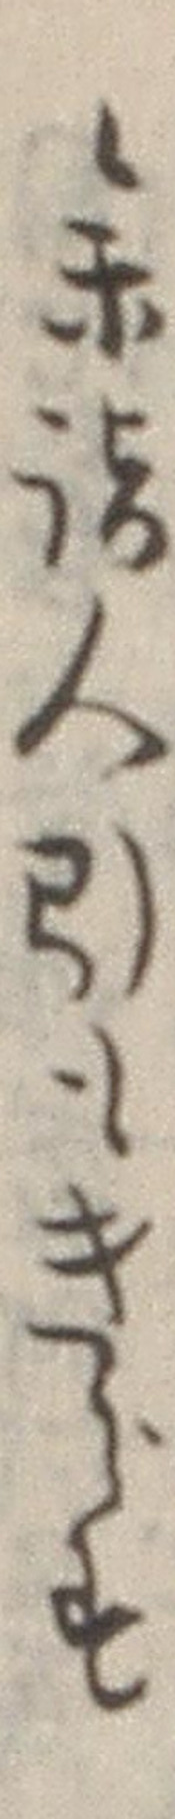参詣人引もきらす

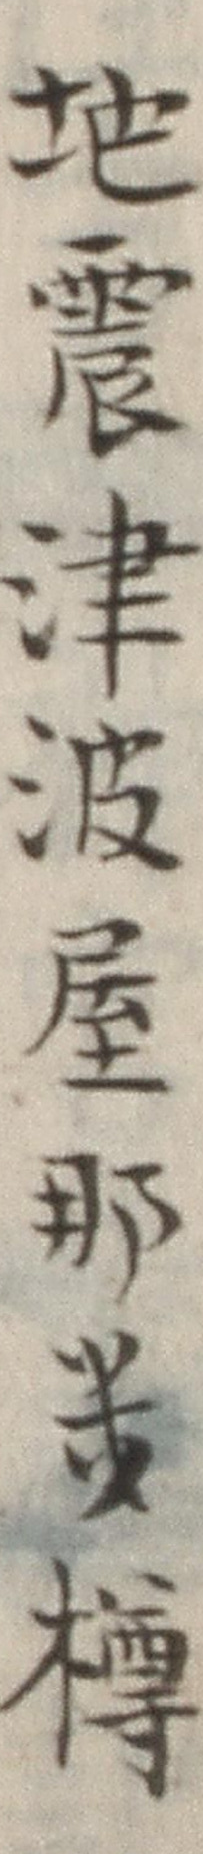地震津波屋那幾樽
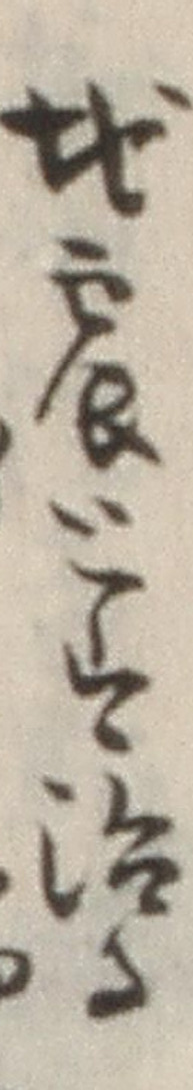地震とは治る
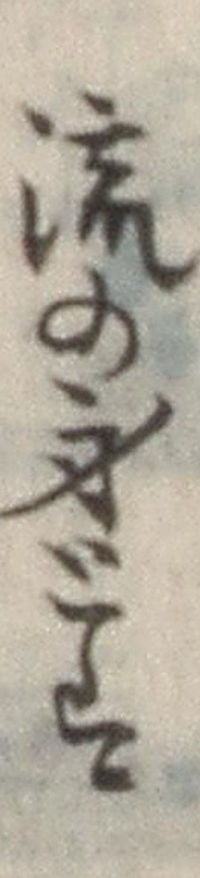流の身とは
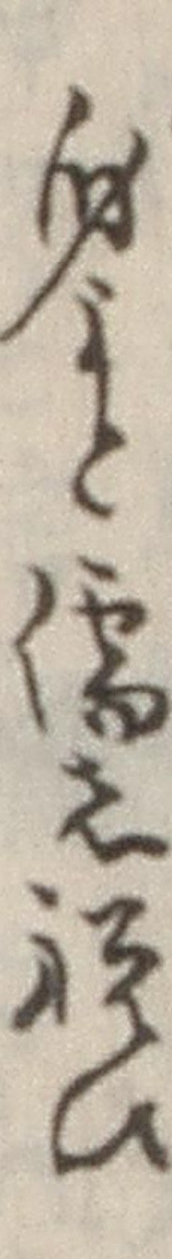身よと儒者祝ひ
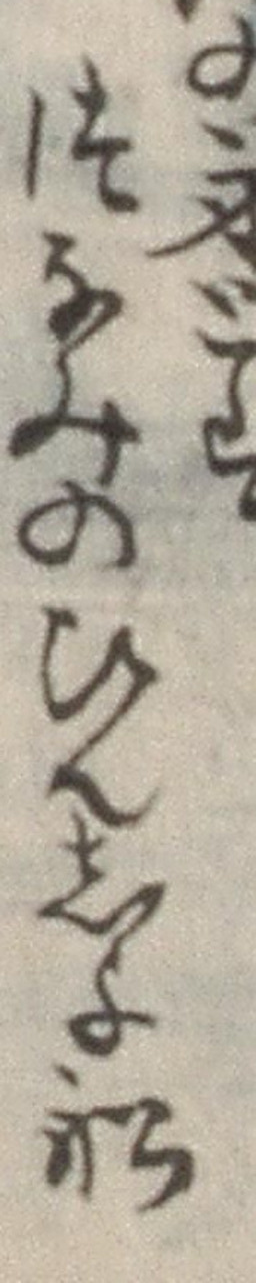つなみのひんしよ舩
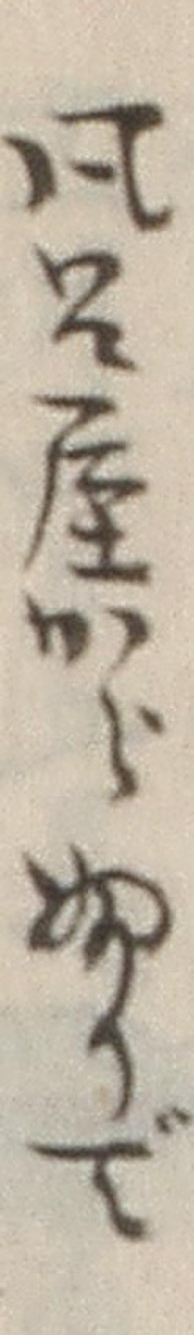風呂屋からふりで
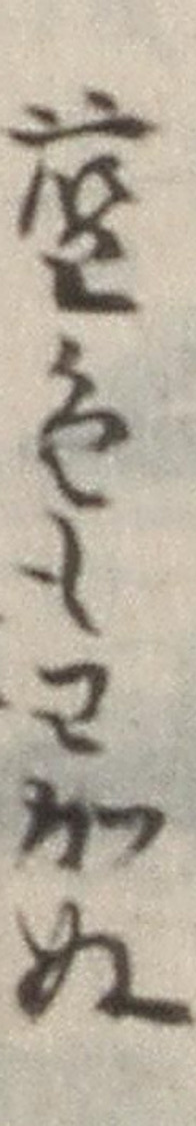藍色もわかぬ
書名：諸國大地震年代記末代噺種
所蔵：東京大学地震研究所図書室 Earthquake Research Institute Library, The University of Tokyo, JAPAN
